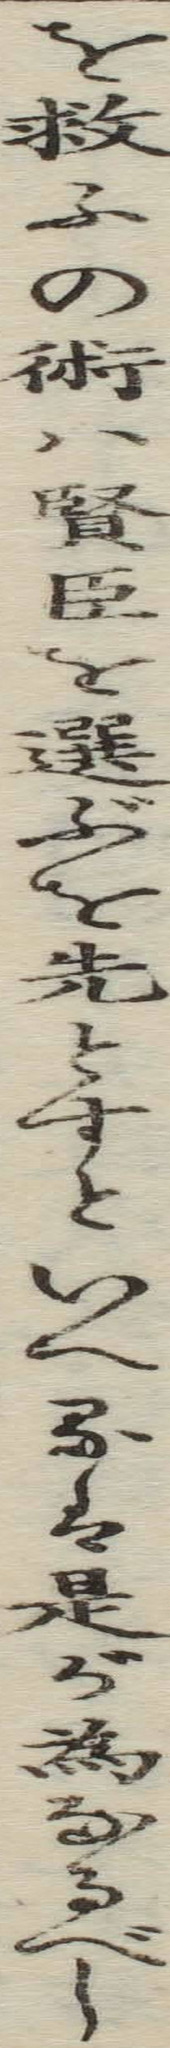を救ふの術は賢臣を選ぶを先とすといへるは是が為なるべし
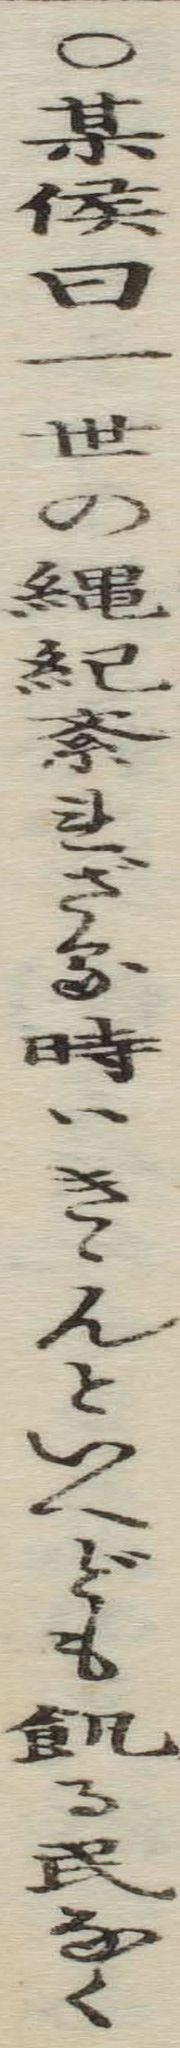○某侯曰一世の縄紀紊れざる時はきゝんといへども飢る民なく
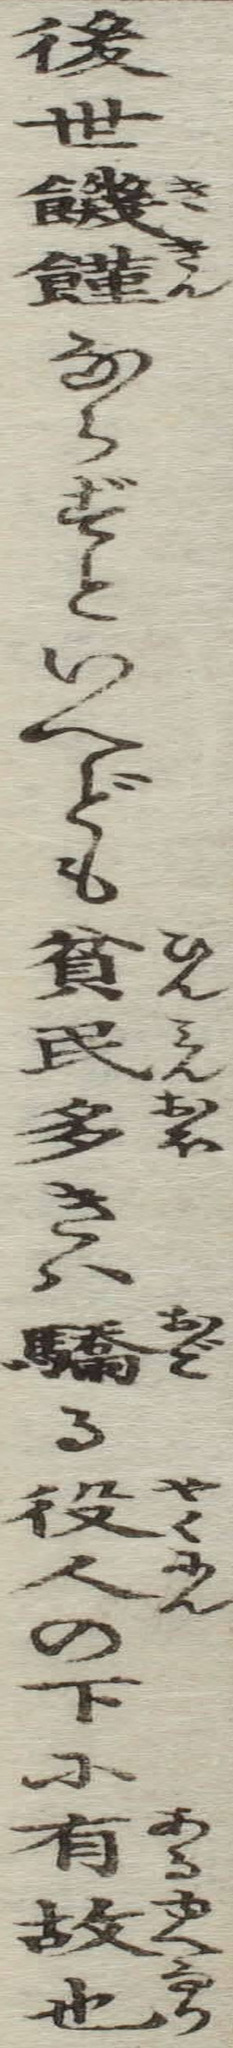後世饑饉ならずといへども貧民多きは驕る役人の下に有故也
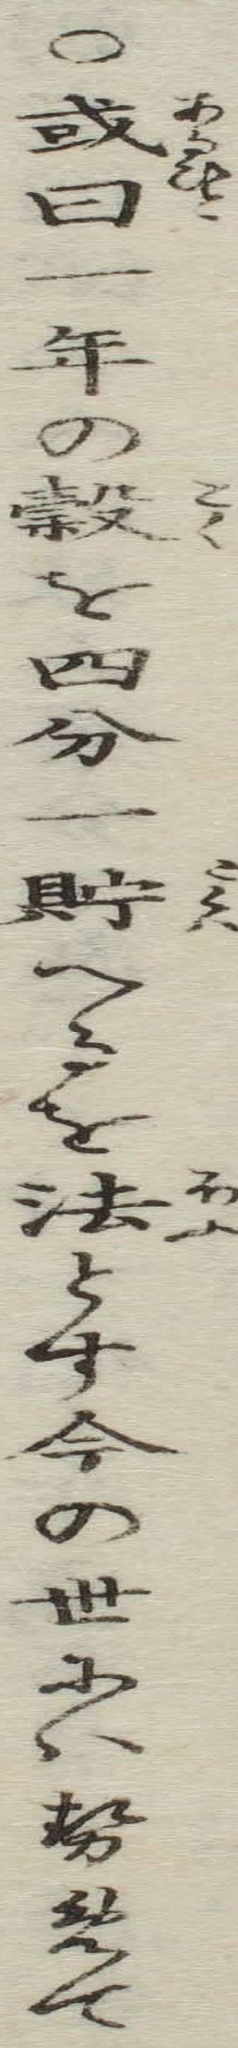○或曰一年の穀を四分一貯へるを法とす今の世にはせめて
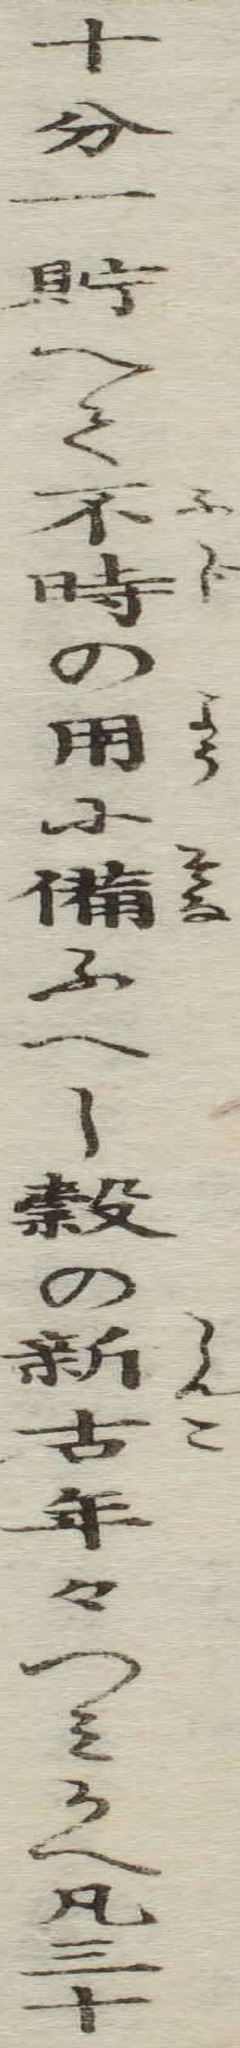十分一貯へて不時の用に備ふへし穀の新古年々つみかへ凡三十
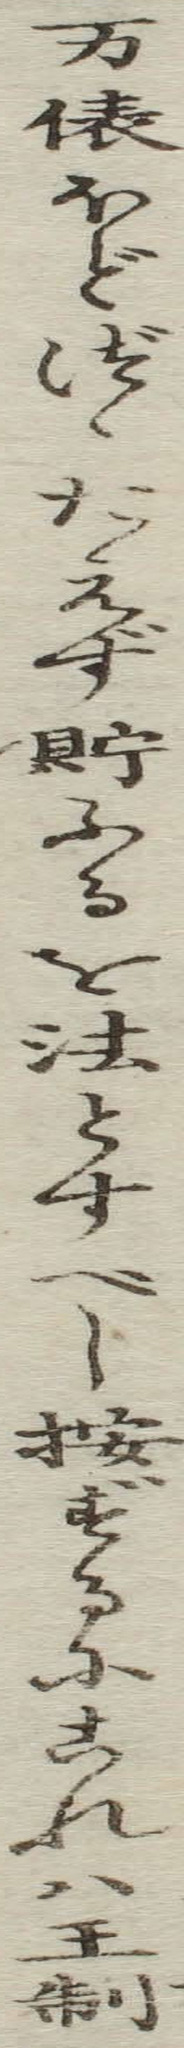万俵ほどづゝたえず貯ふるを法とすべし按ずるにこれは王制
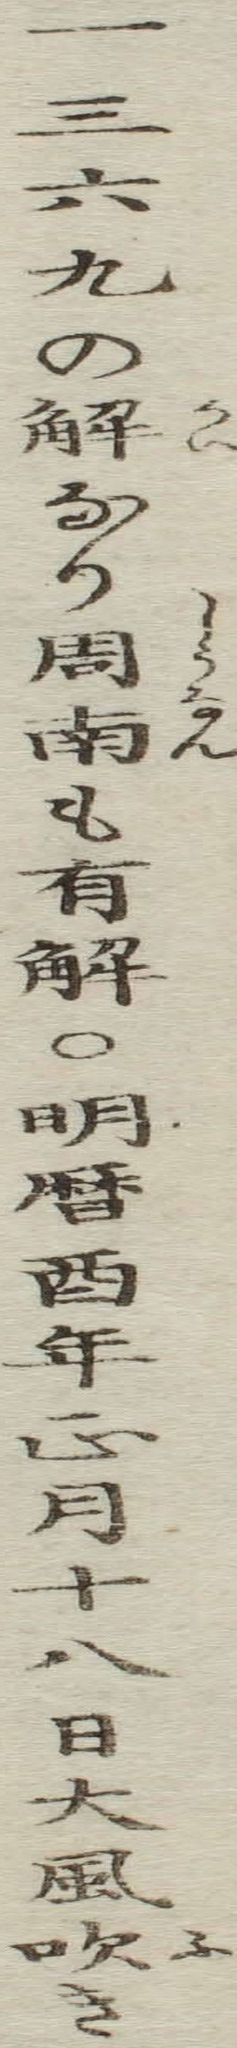一三六九の解なり周南も有解○明暦酉年正月十八日大風吹き
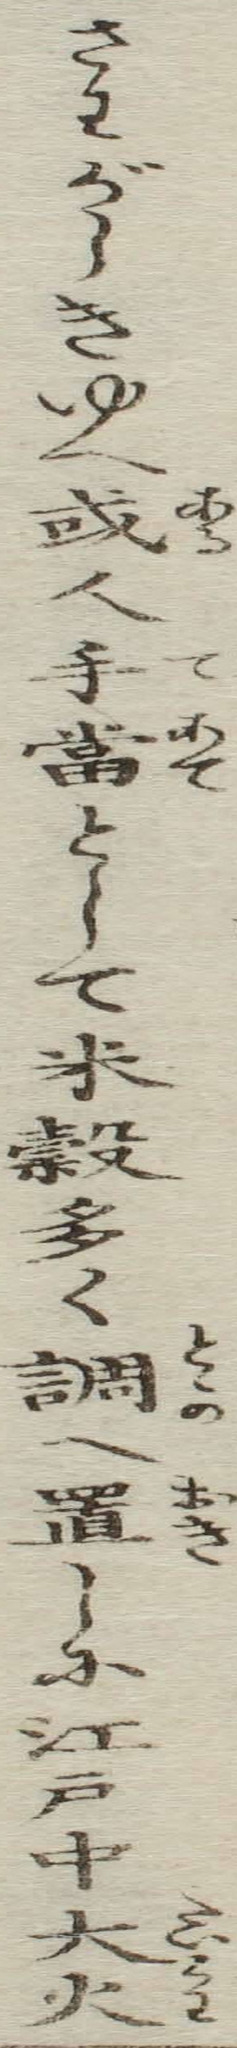さわがしきゆへ或人手当として米穀多く調へ置しに江戸中大火
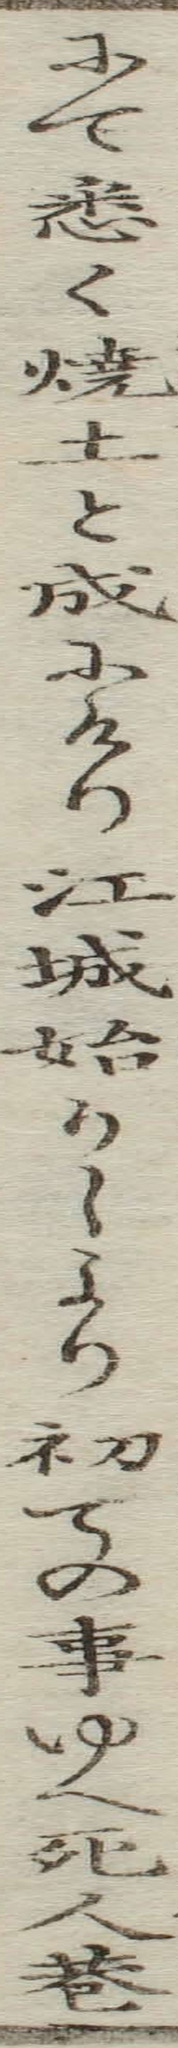にて悉く焼土と成にけり江城始りしより初ての事ゆへ死人巷
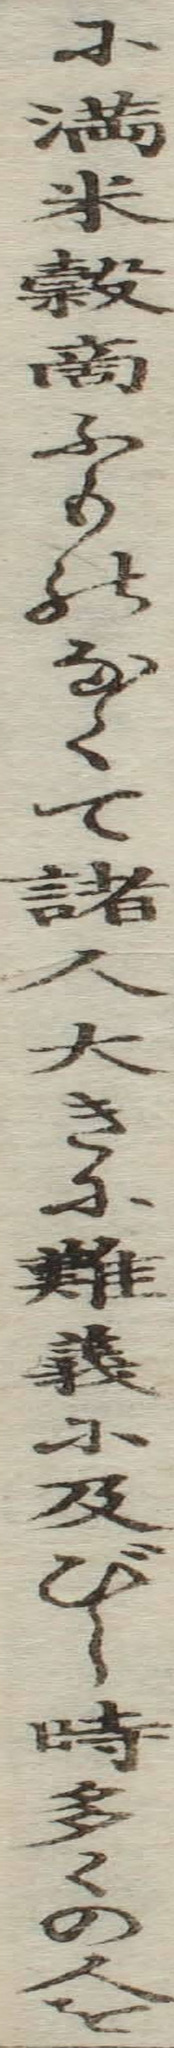に満米穀商ふものなくて諸人大きに難義に及びし時多くの人を

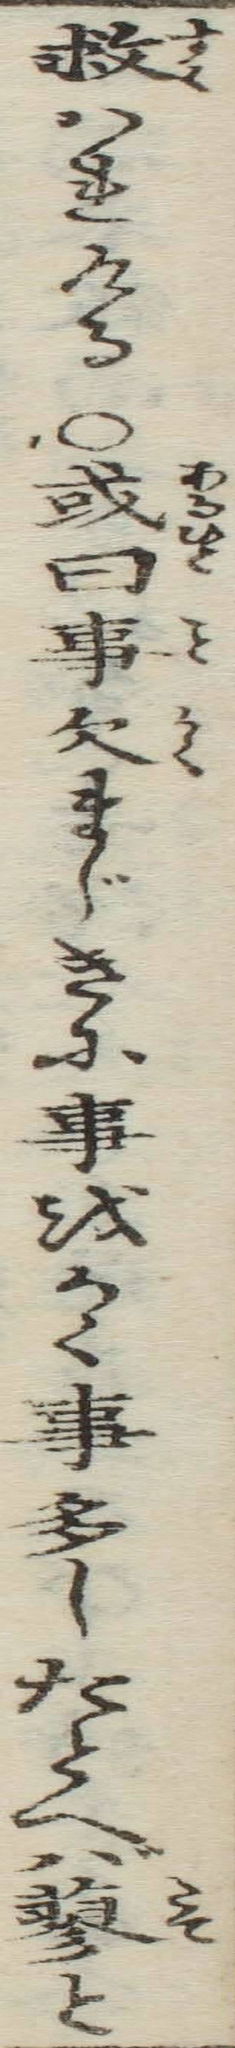救はれける○或曰事欠まじきに事をかく事多したとへば蓼と
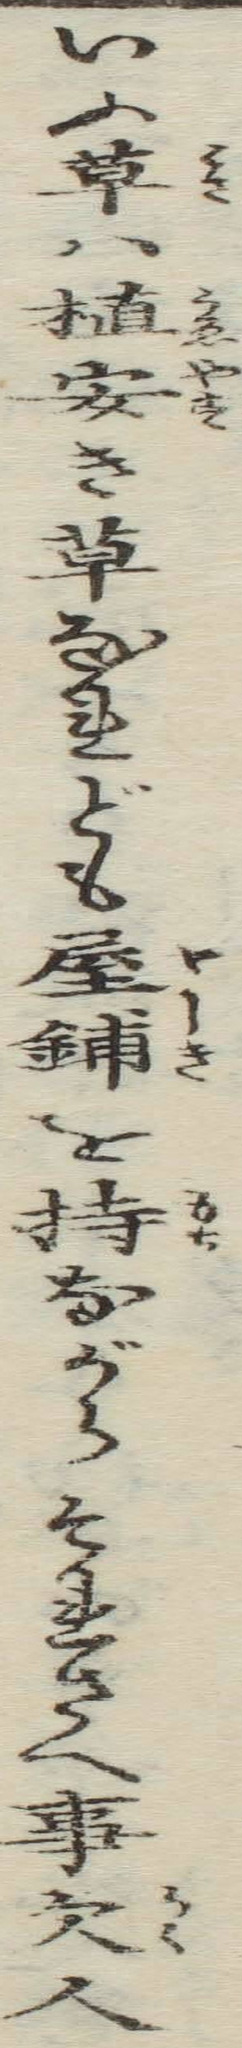いふ草は植安き草なれども屋鋪を持ながらそれさへ事欠人
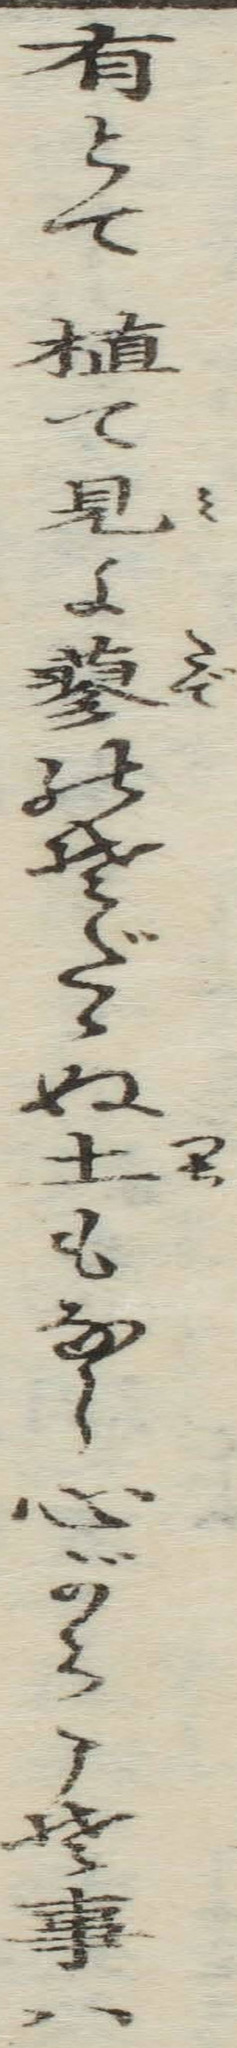有とて植て見よ蓼のそだゝぬ土もなし心がたくこそ事は
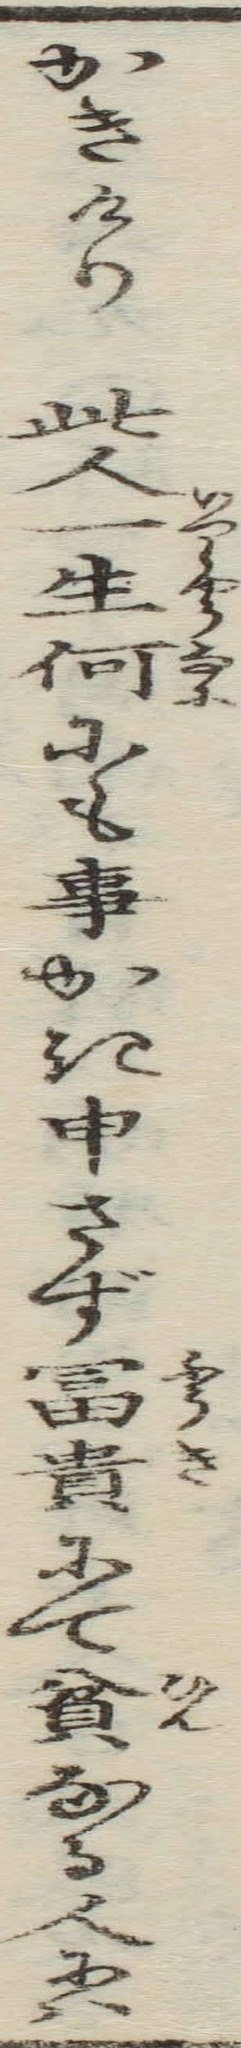かきけり此人一生何にも事かき申さず富貴にて貧なる人には
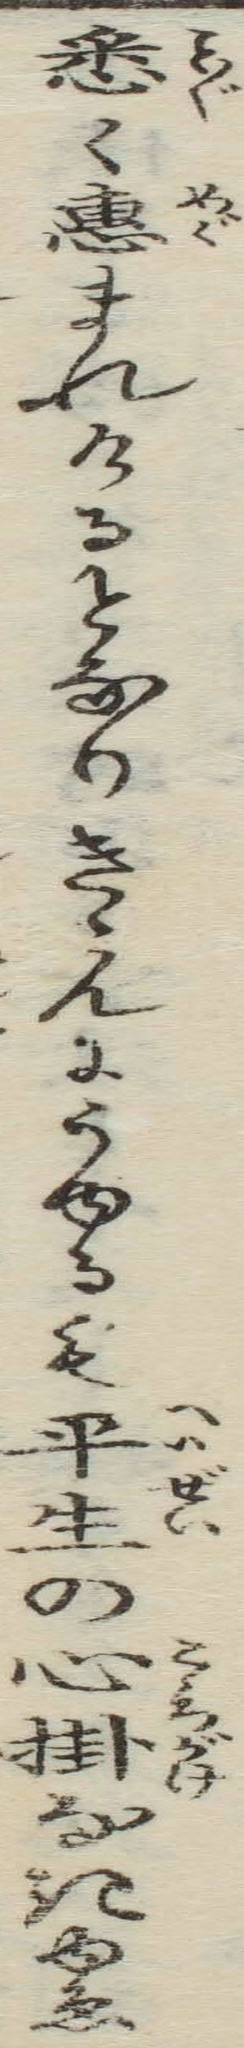悉く恵まれけるとなりきゝんにうゆるも平生の心掛なきゆゑ
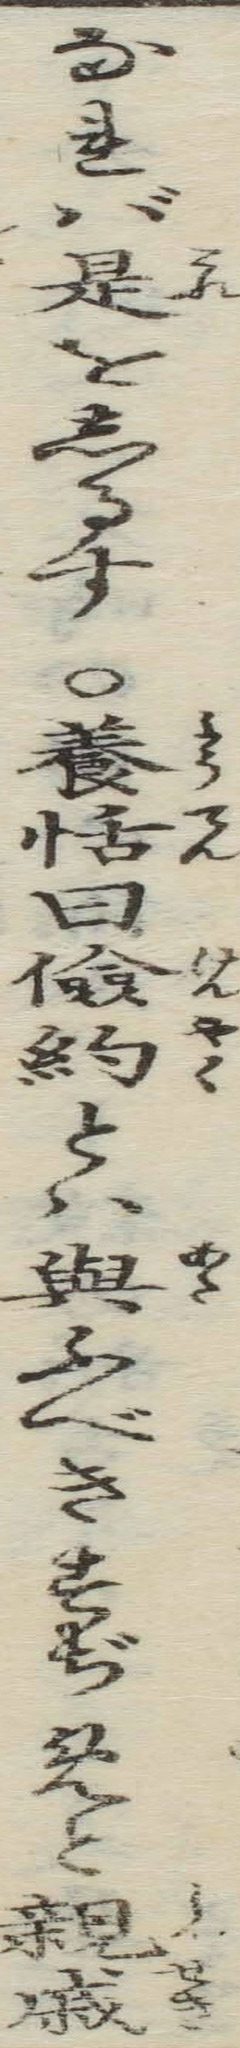なれば是をしるす○養恬曰倹約とは与ふべきすぢめと親戚
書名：救荒便覧
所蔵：国文学研究資料館
